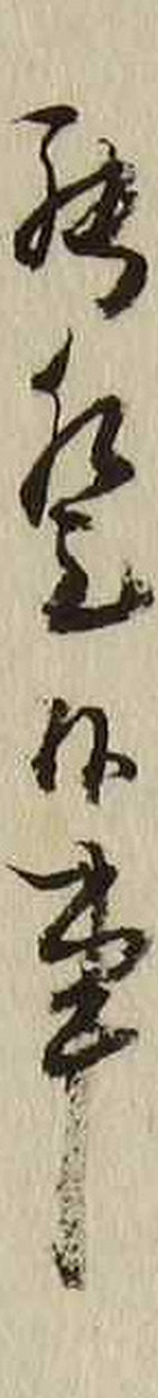罷登候事
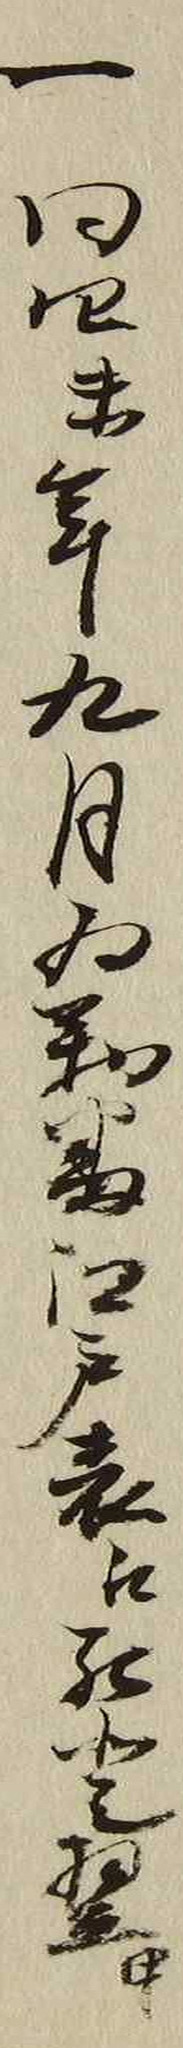一同四未年九月為勤番江戸表江罷登翌申
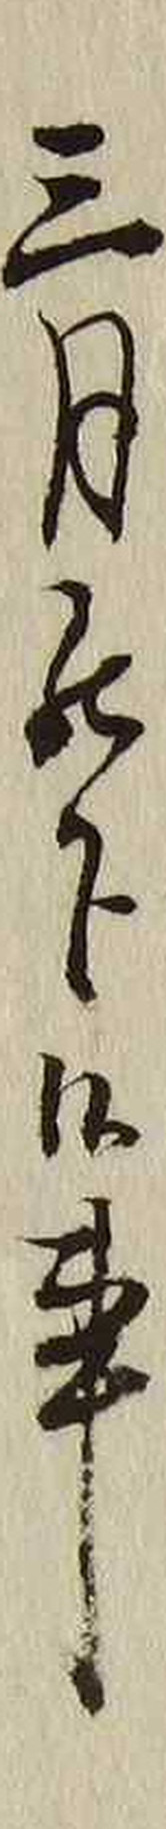三月罷下候事
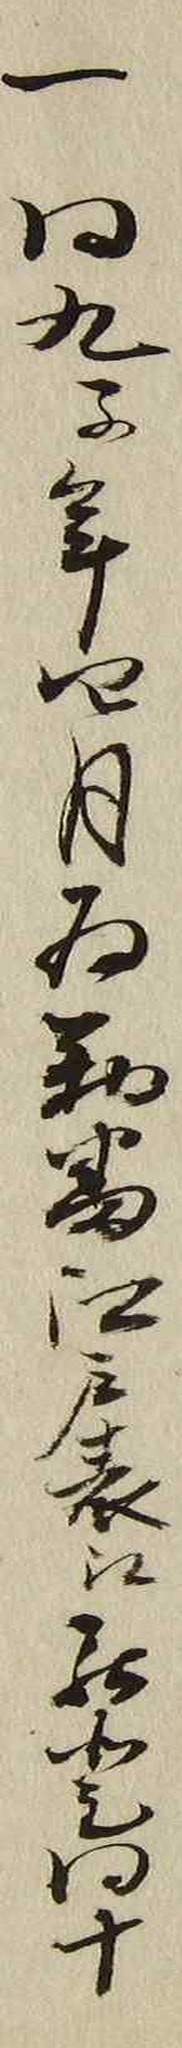一同九子年四月為勤番江戸表江罷登同十
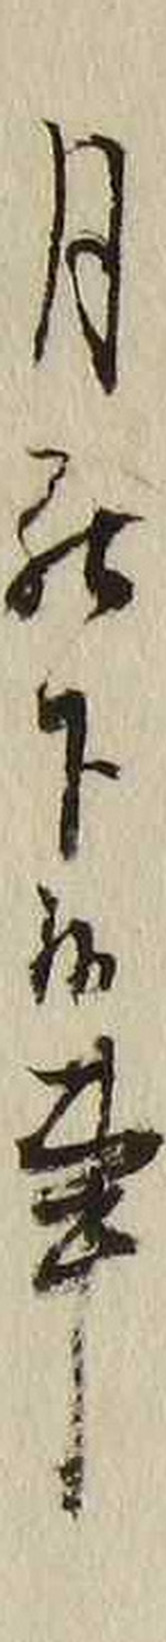月罷下候事
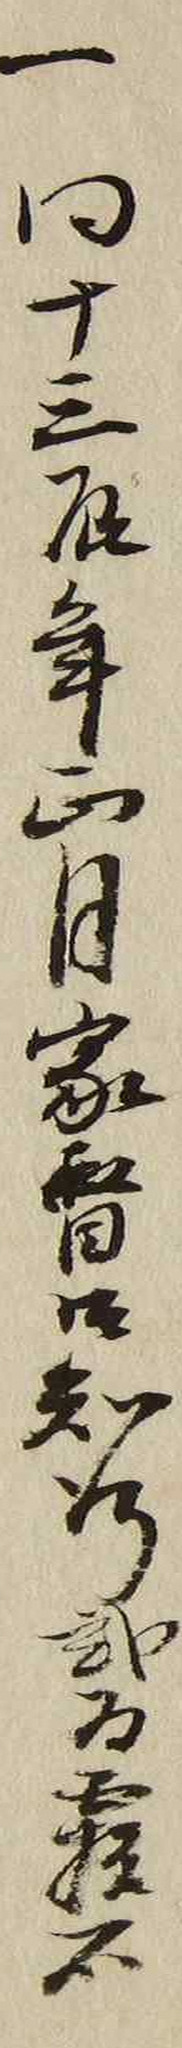一同十三辰年正月家督御知行弐百五拾石
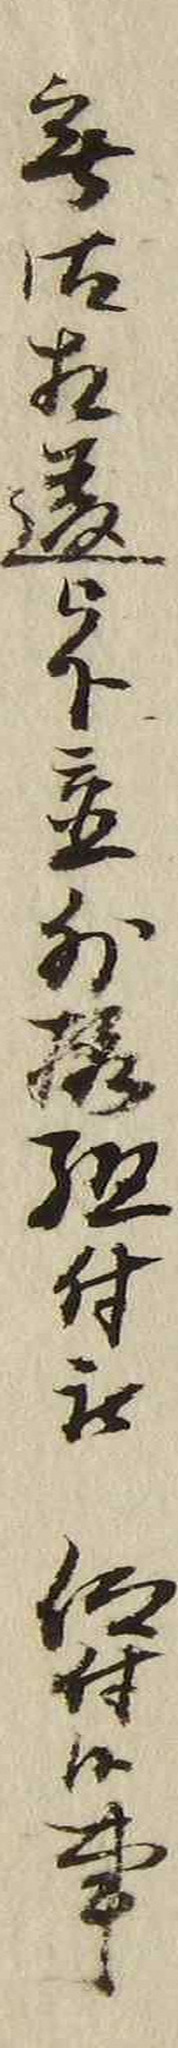無御相違被下置外様組付被仰付候事

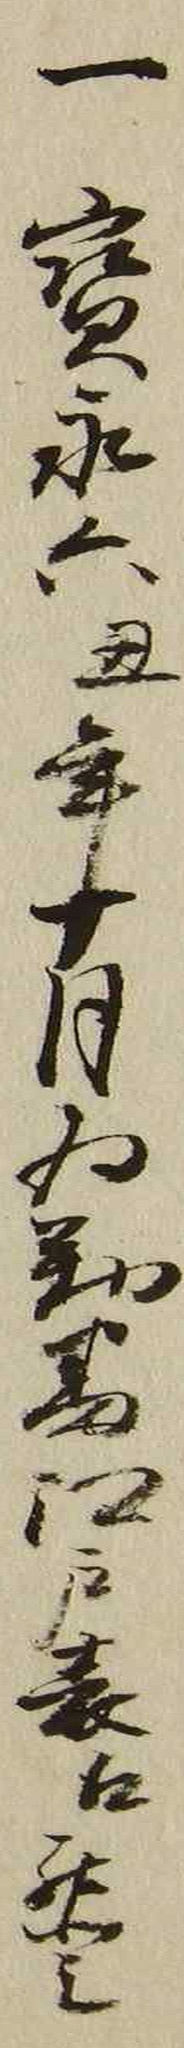一宝永六丑年十月為勤番江戸表江罷登
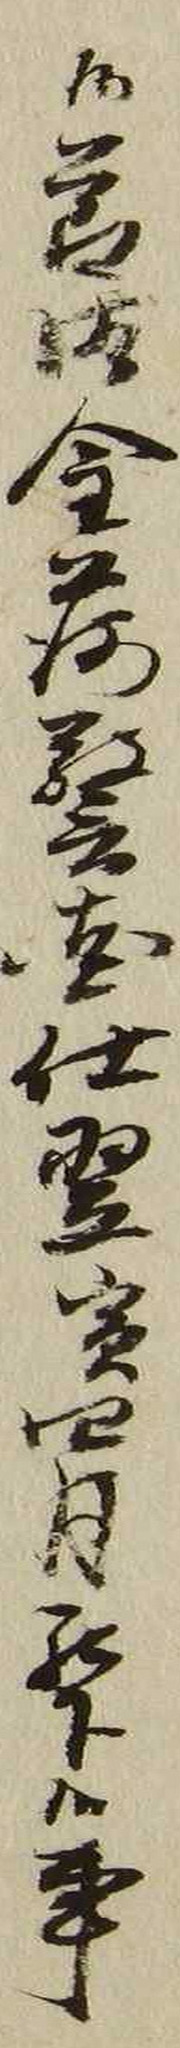候節御金荷警固仕翌寅四月罷下候事
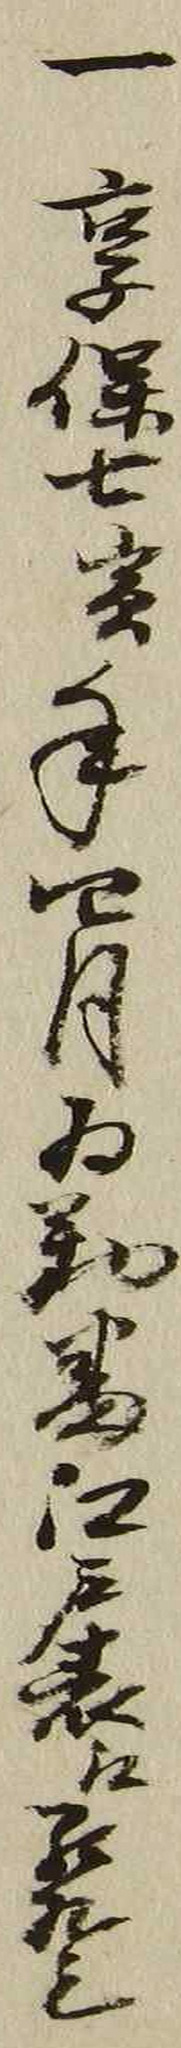一享保七寅年四月為勤番江戸表江罷登
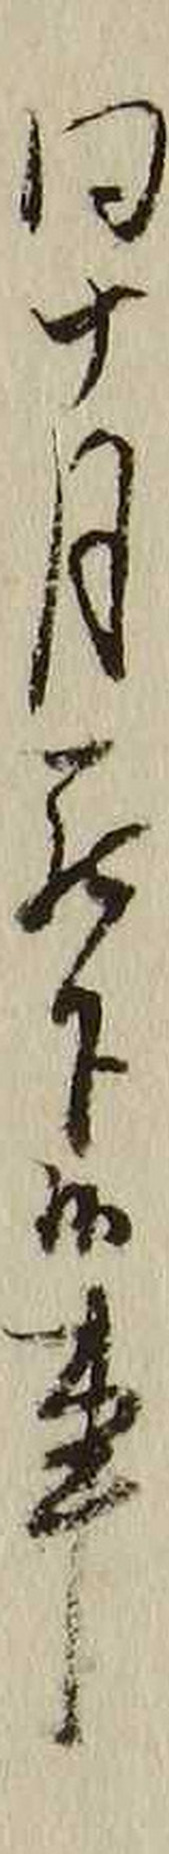同十月罷下候事
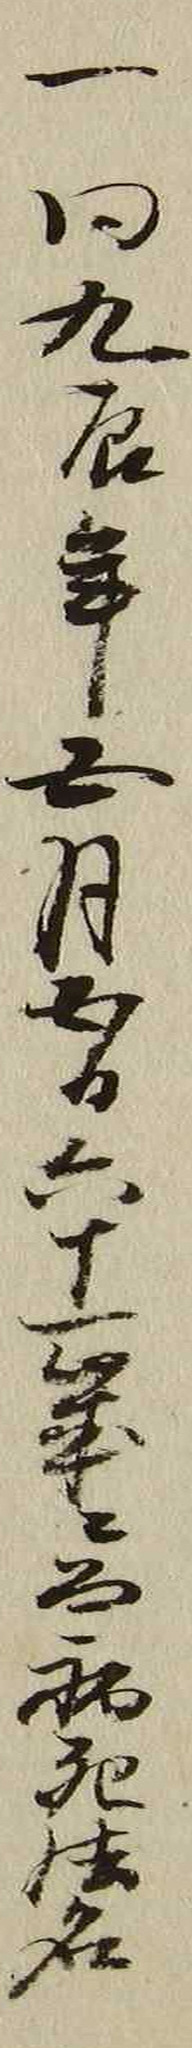一同九辰年五月五日六十一歳ニ而病死法名
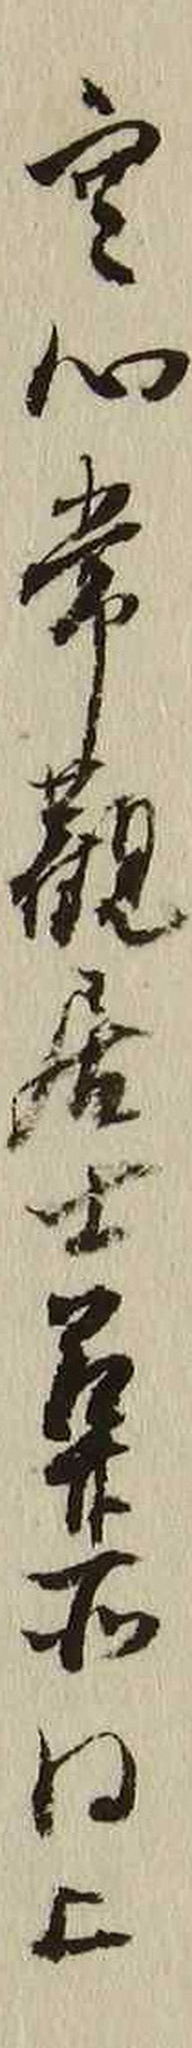空心常観居士葬所同上
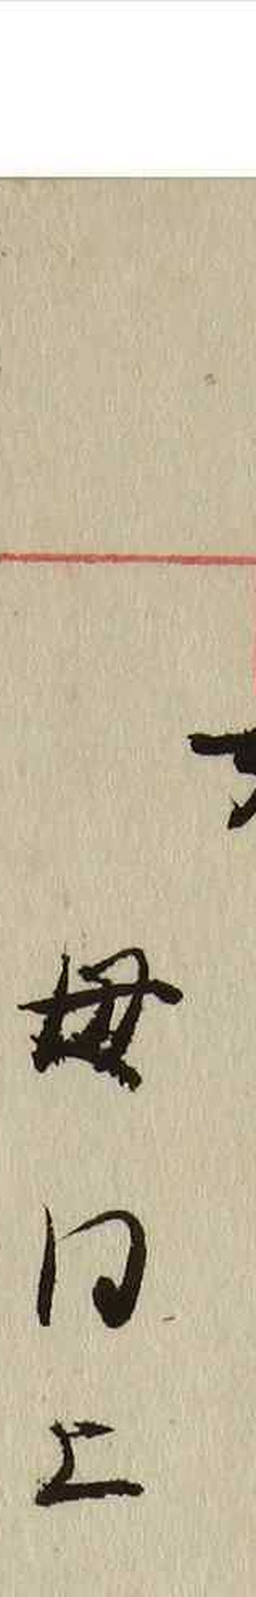母同上
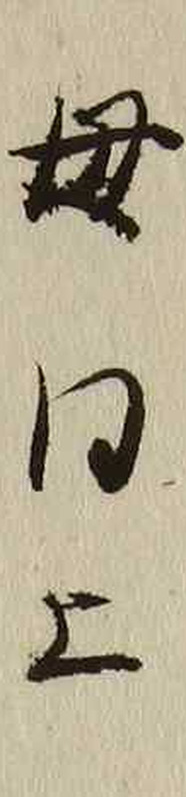母同上
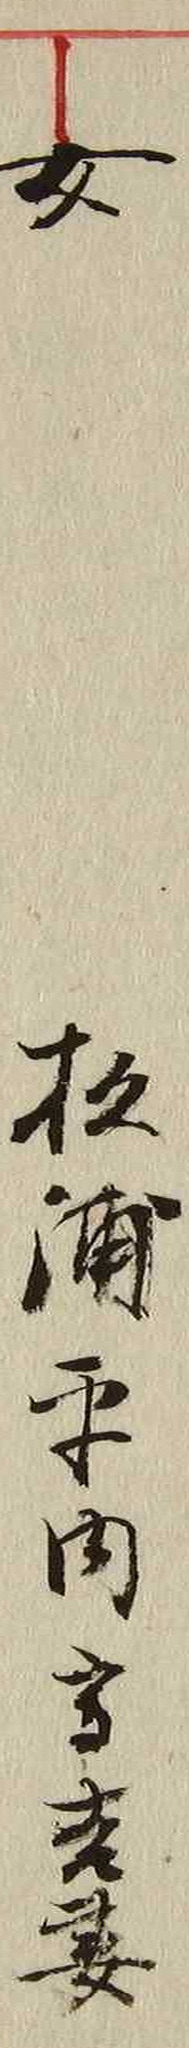女杉浦平内高吉妻
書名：諸士系譜　巻之349　も之部5
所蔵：会津若松市立会津図書館
